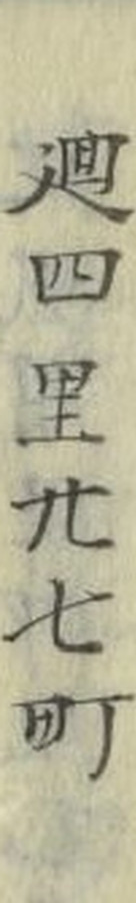廻四里廾七町
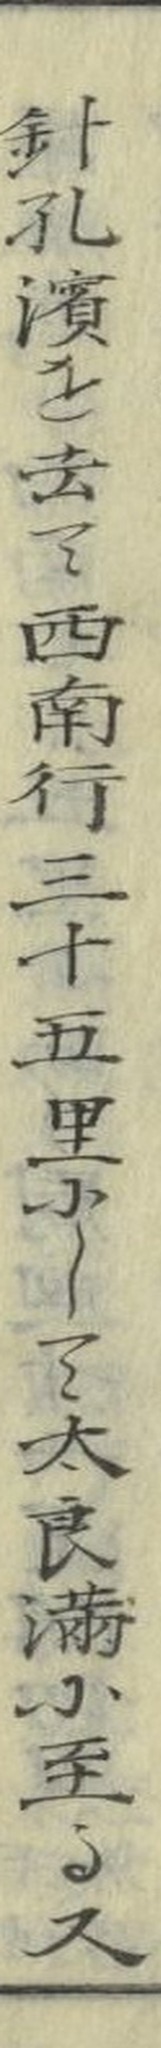針孔浜を去て西南行三十五里にして太良満に至る又
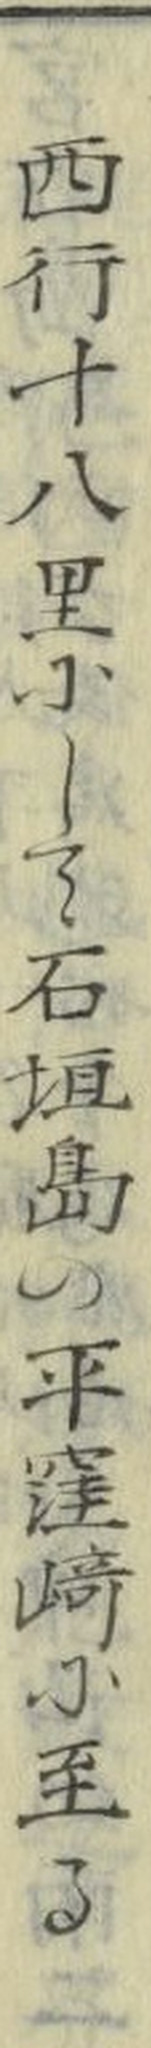西行十八里にして石垣島の平窪崎に至る
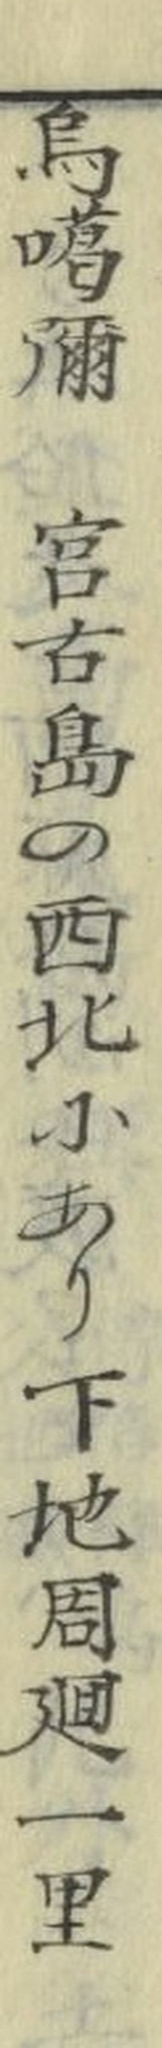烏噶弥宮古島の西北にあり下地周廻一里
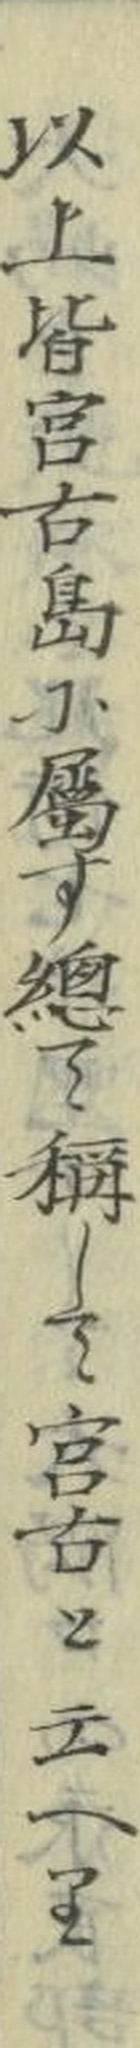以上皆宮古島に属す総て称して宮古と云へり
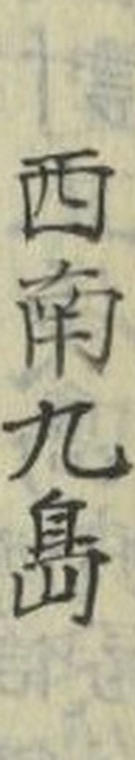西南九島
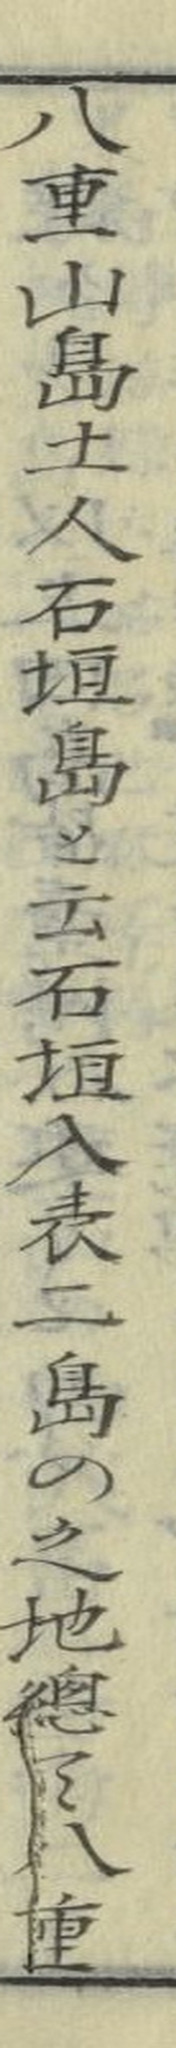八重山島土人石垣島と云石垣入表二島の之地総て八重
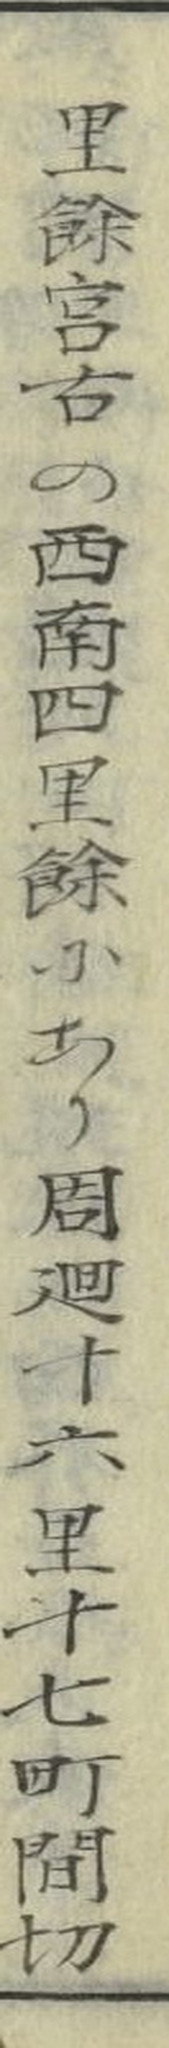里餘宮古の西南四里餘にあり周廻十六里十七町間切
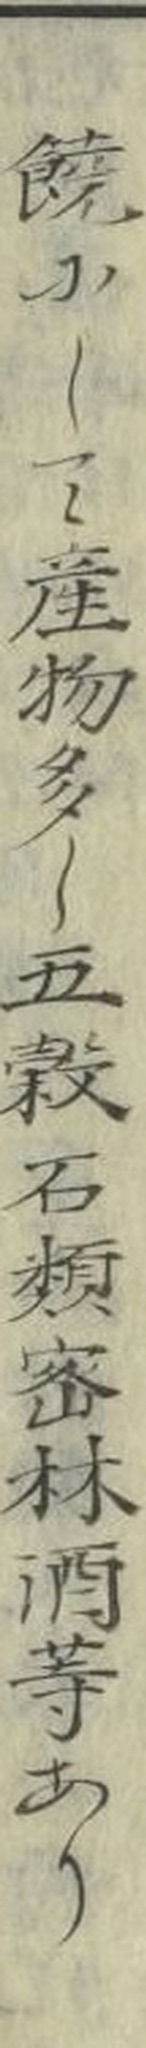饒にして産物多し五穀石類密林酒等あり
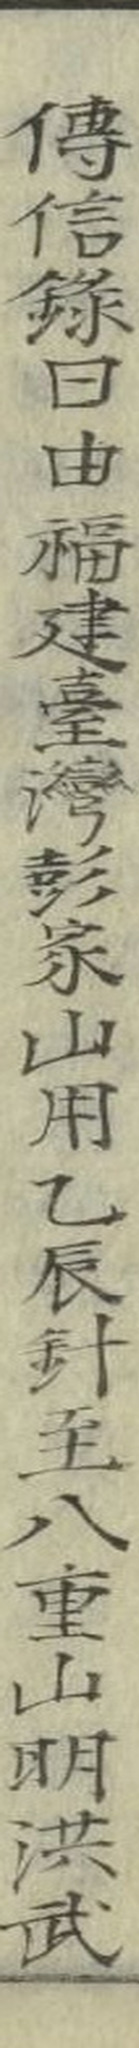伝信録曰由福建台湾彭家山用乙辰針至八重山明洪武
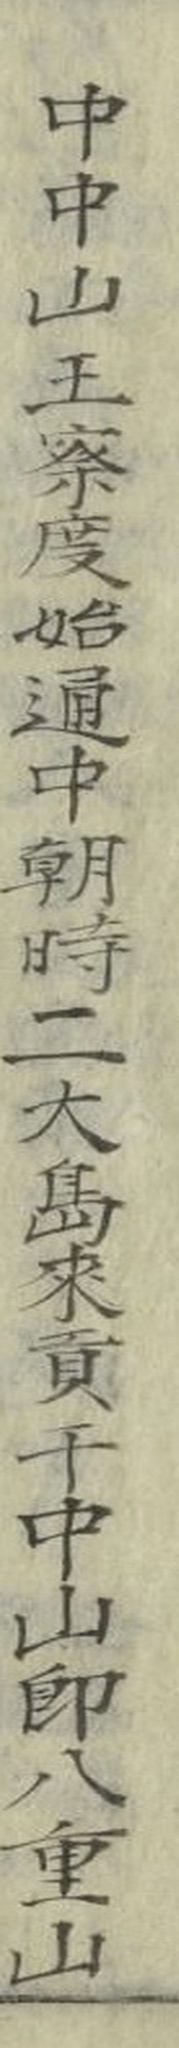中中山王察度始通中朝時二大島来貢于中山即八重山
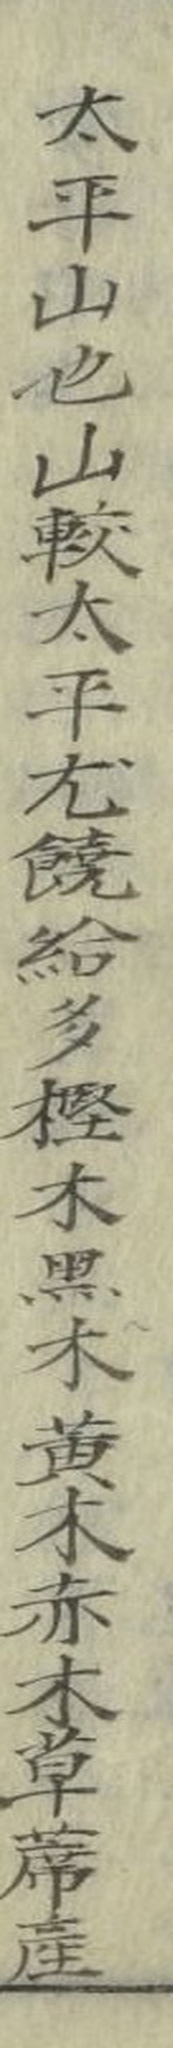大平山也山較太平尤饒給多樫木黒木黄木赤木草蓆産
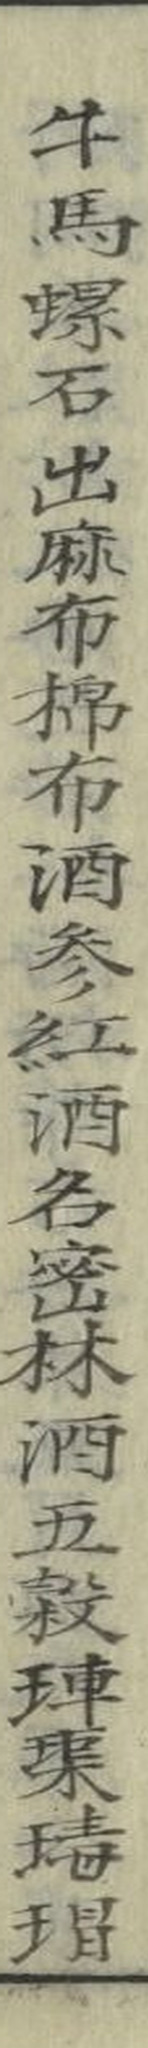牛馬螺石出麻布棉布酒参紅酒名密林酒五穀硨璩瑇琩

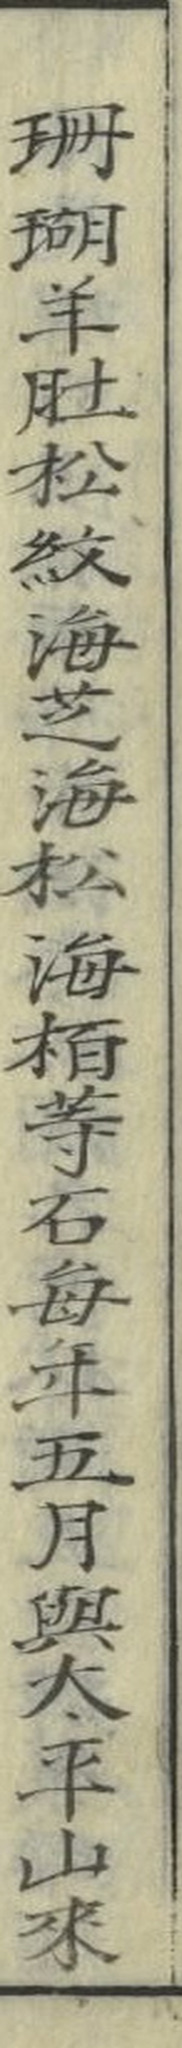珊瑚羊肚松紋海芝海松海栢等石毎年五月与太平山来
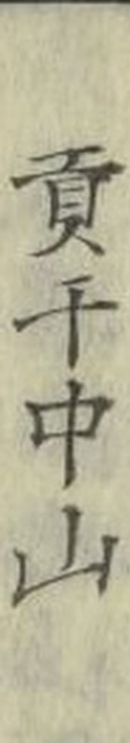貢于中山
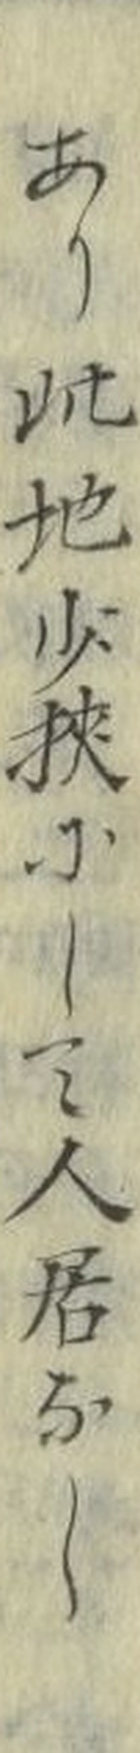あり此地少狭にして人居なし
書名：琉球沿革志 上
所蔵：University of the Ryukyus Library
